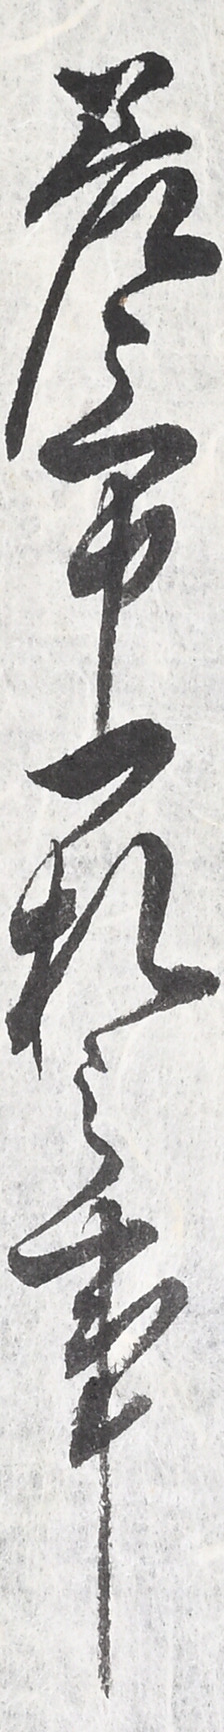差上申一札之事
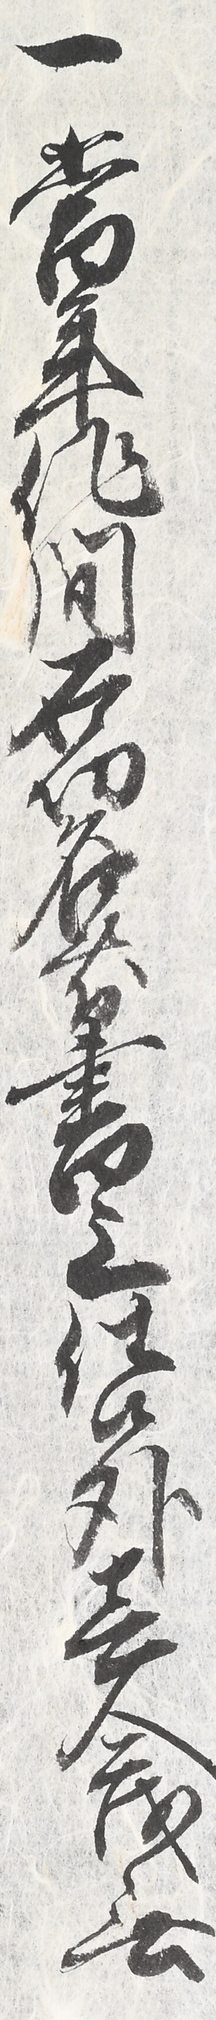一当年作間石切名前書上仕候外壱人も無
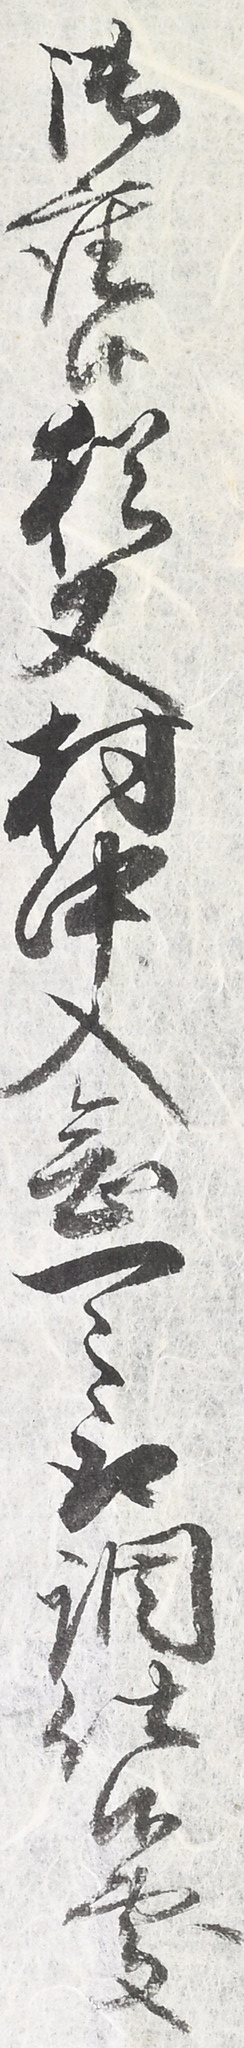御座候猶又村中入念可取調仕候処
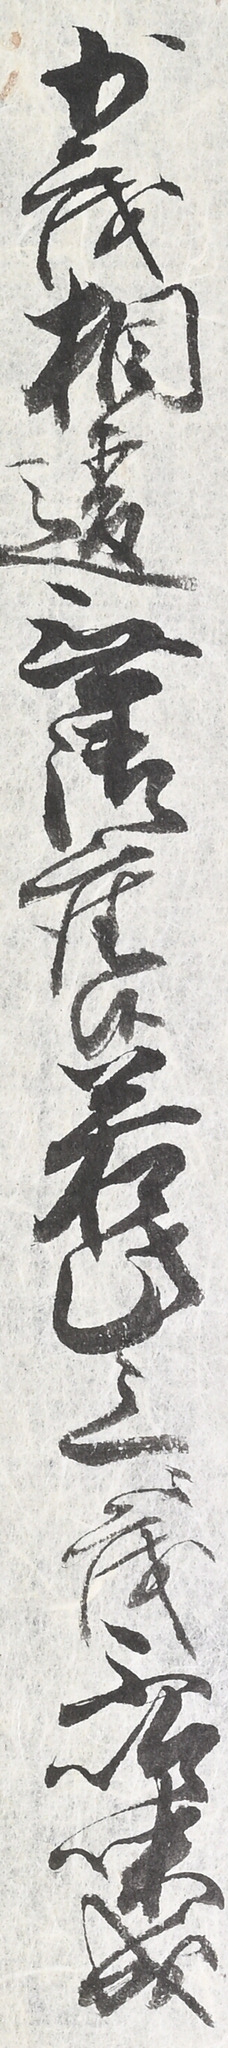少も相違無御座候若此上にも不吟味成
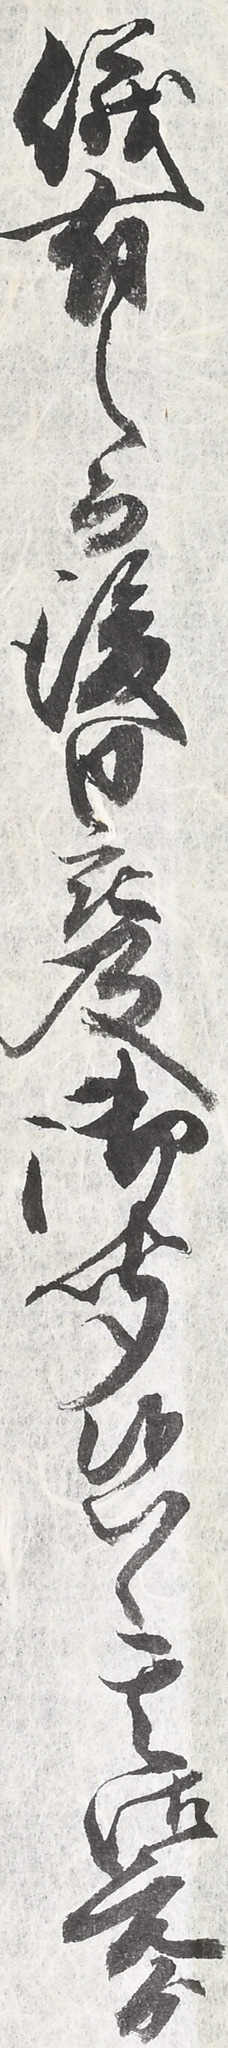儀有之而後日被及御聞候はゝ其御元ゟ
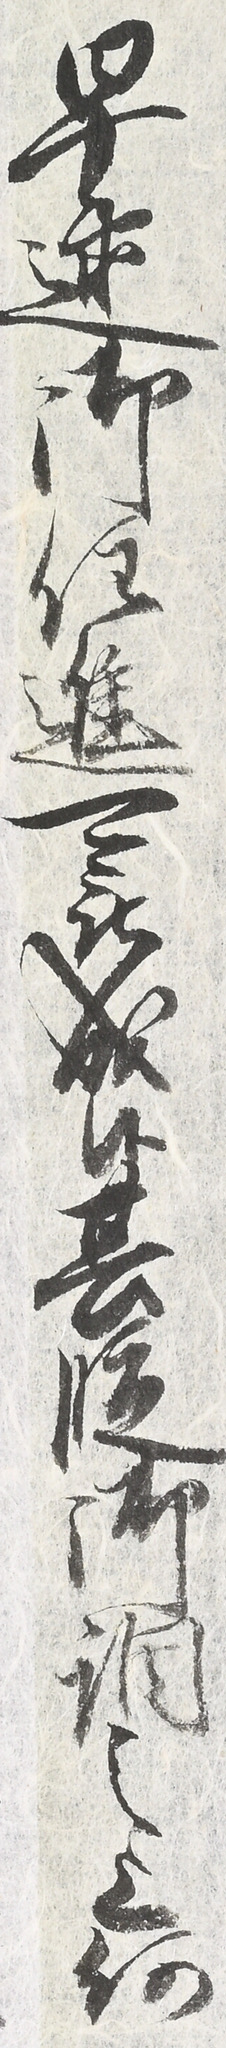早速御注進可被成候其段御調之上何
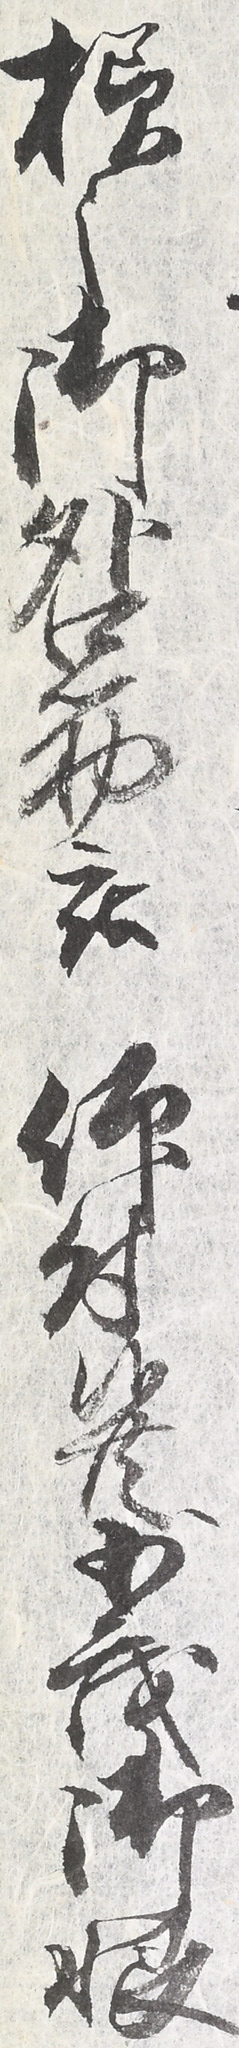様之御咎筋被仰付候共少も御恨
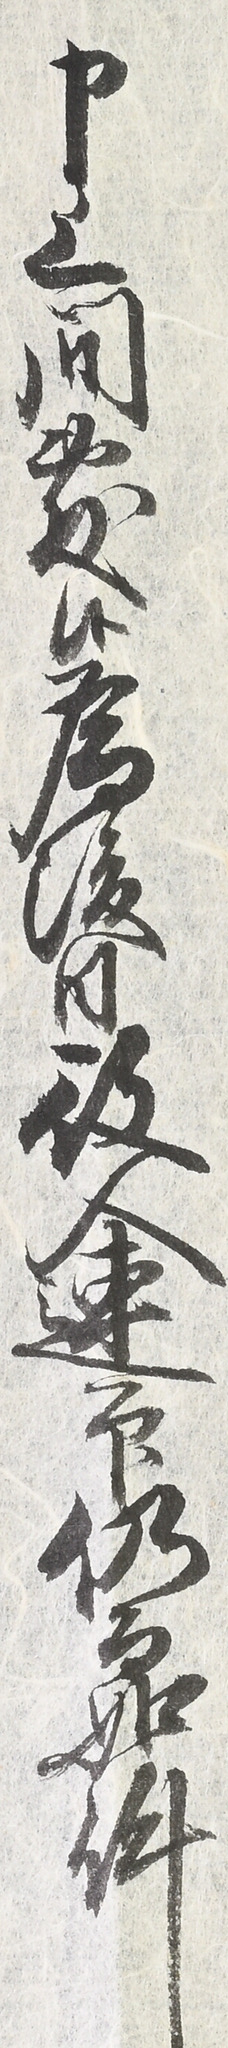申上間敷候為後日役人連印仍而如件
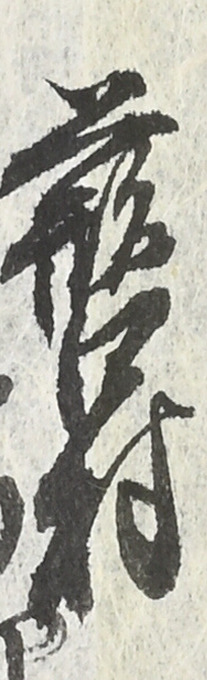荊口村
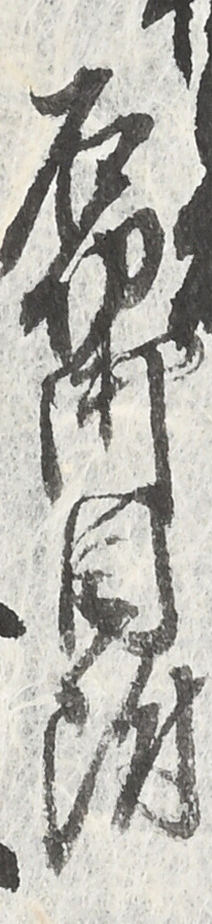石切御目附
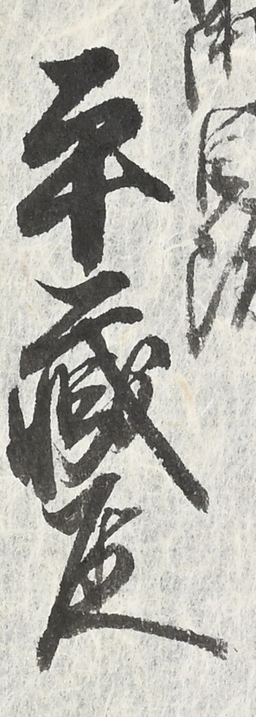平蔵殿
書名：差上申一札之事
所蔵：伊那市立高遠町図書館・合同会社AMANE
